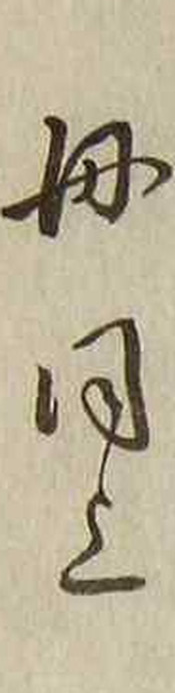母同上

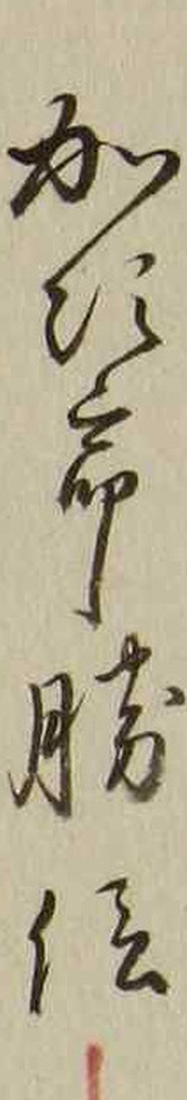加次郎勝伝
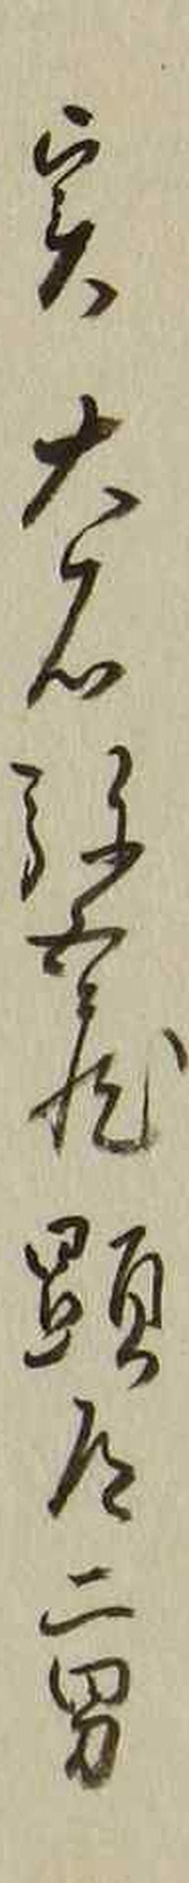実大石弥五蔵顕道二男
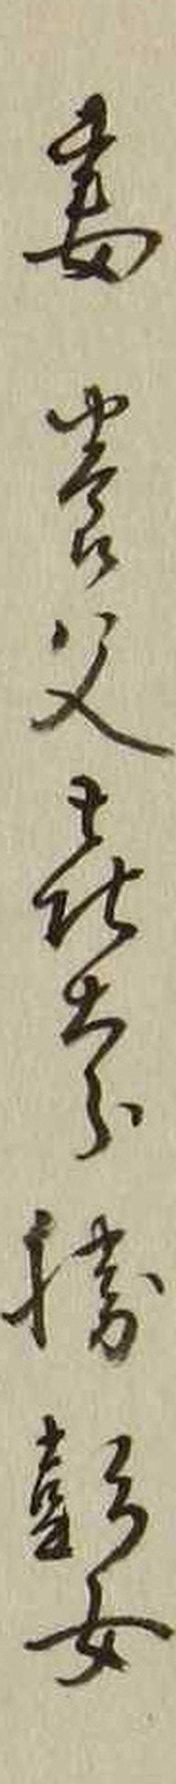妻養父喜太郎勝彭女
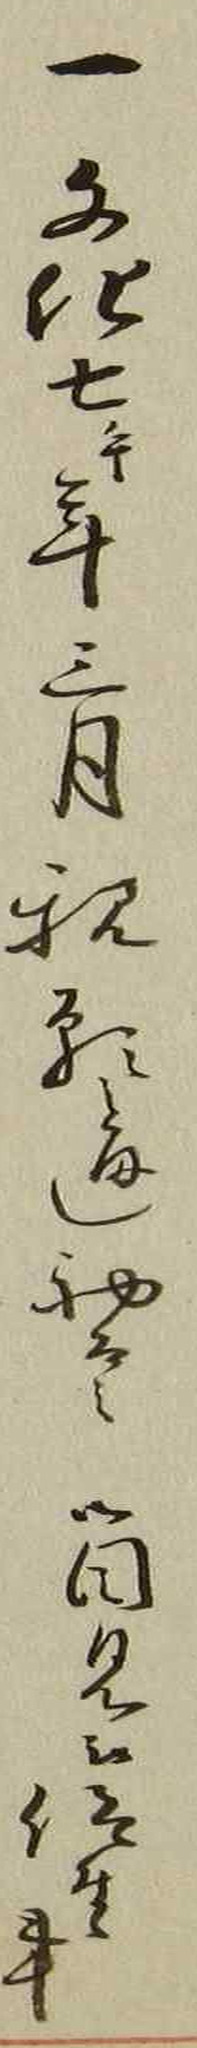一文化七午年三月親願之通初而之御目見被仰付候事
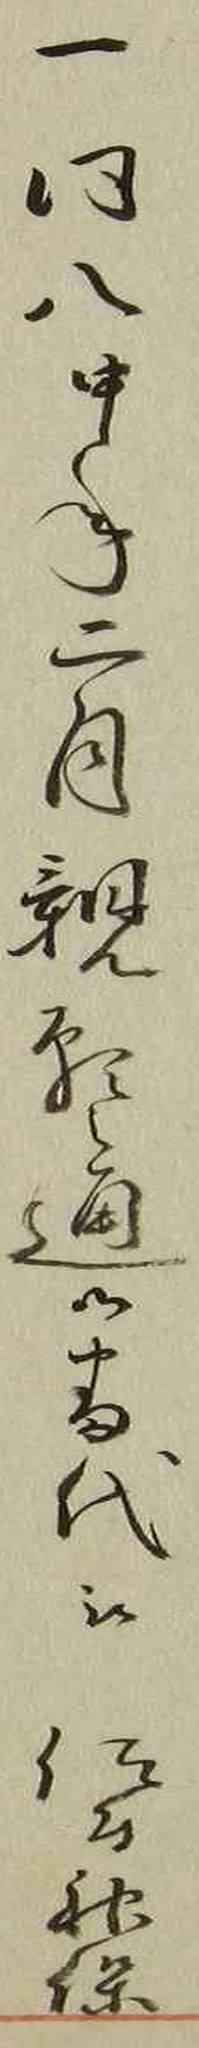一同八申年二月親願之通御番代被仰付神保
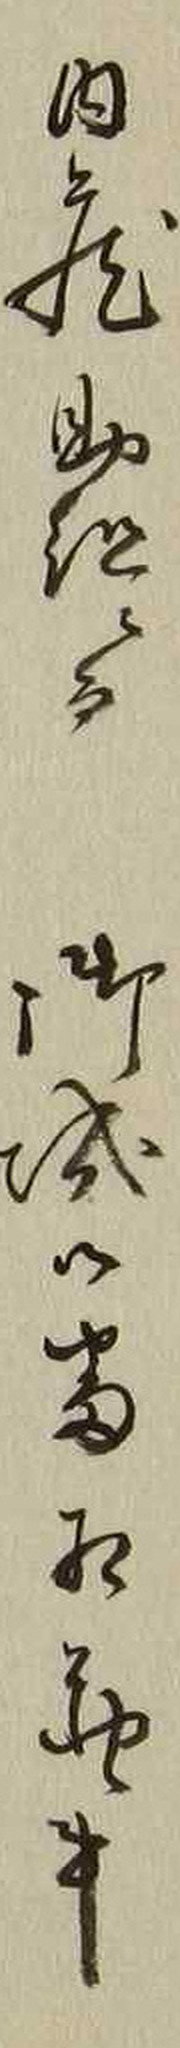内蔵助組に而御城御番相勤候事
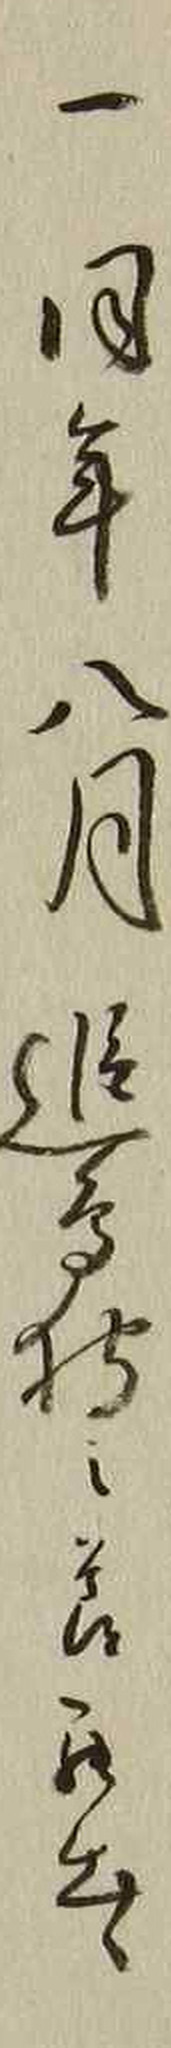一同年八月追鳥狩之節罷成候
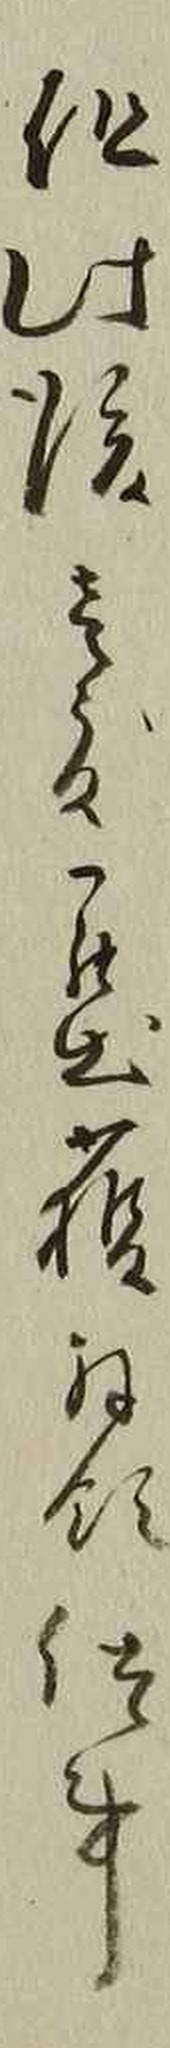但此後壱度罷出獲物領仕候事
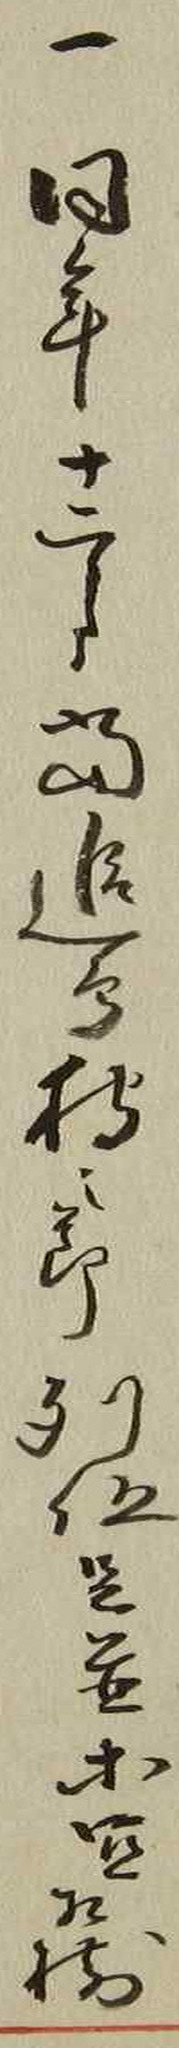一同年十二月当追鳥狩之節列伍足並等宜相揃
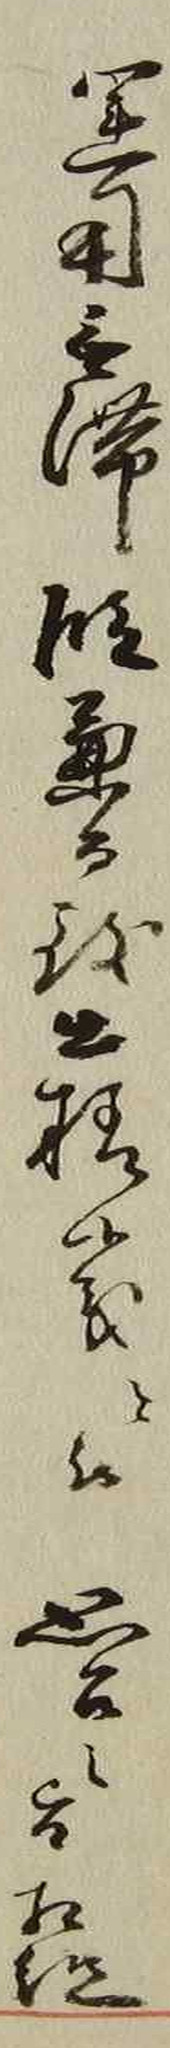運用無滞段兼而致出精候義と被思召之旨被相組
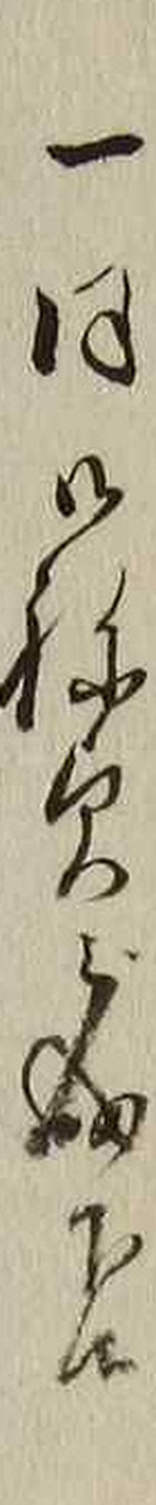一同御称美被成下候
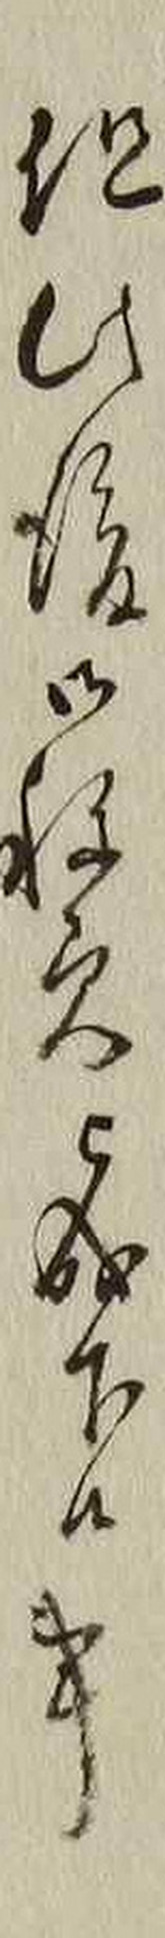但此後御称美被成下候事
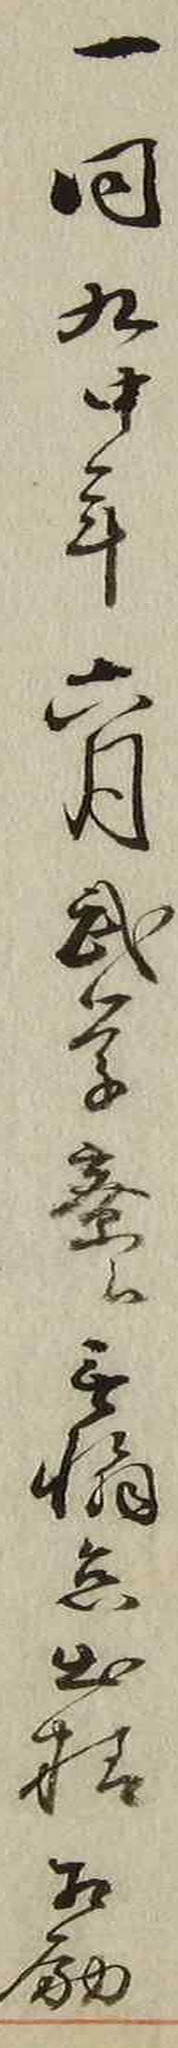一同九申年六月武学寮江無懈怠出精相励
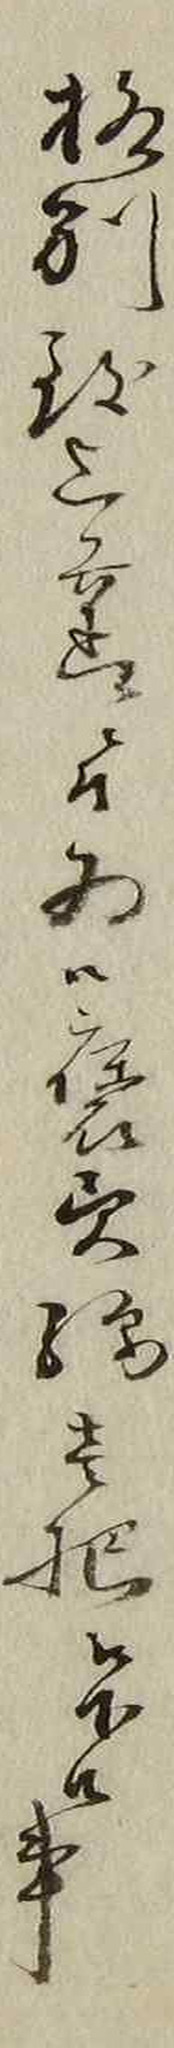格別致上達に付為御褒美綿壱把被下候事
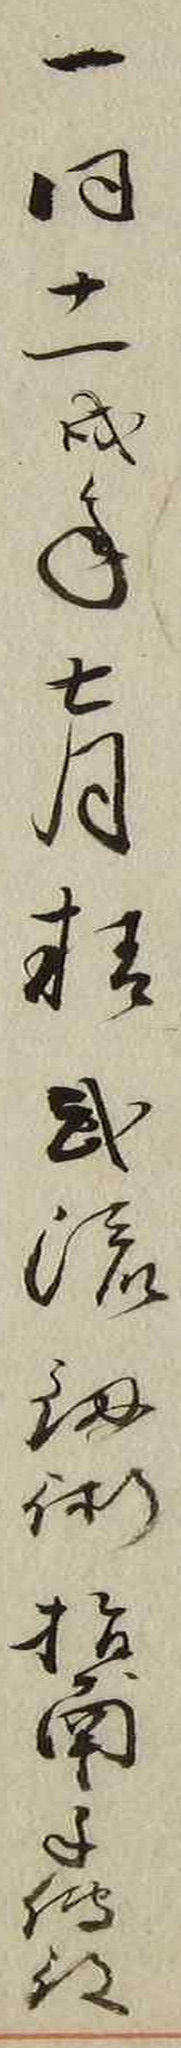一同十一戌年七月精武流鈿術指南手傳役
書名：諸士系譜　巻之6　い之部6
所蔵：会津若松市立会津図書館
